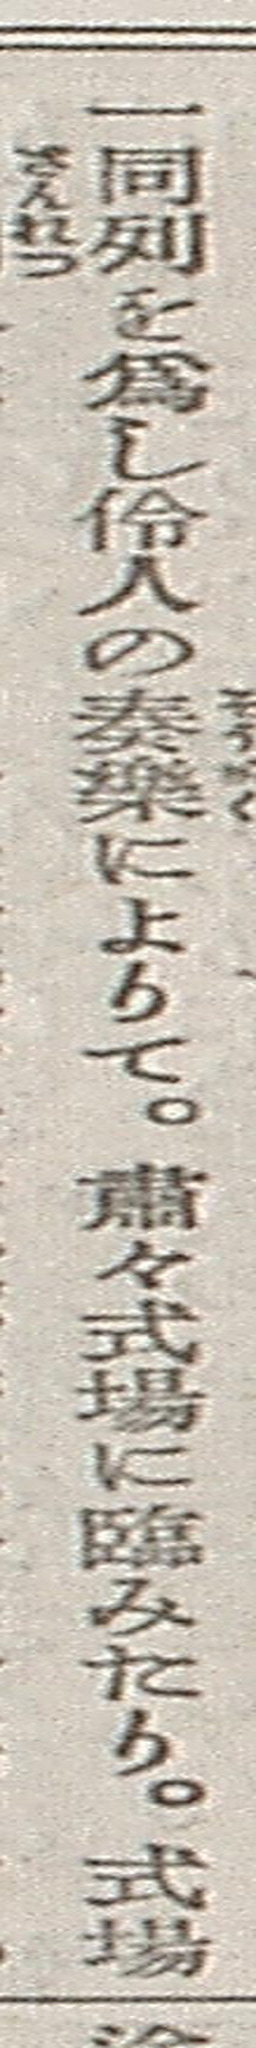一同列を為し伶人の奏楽によりて。粛々式場に臨みたり。式場
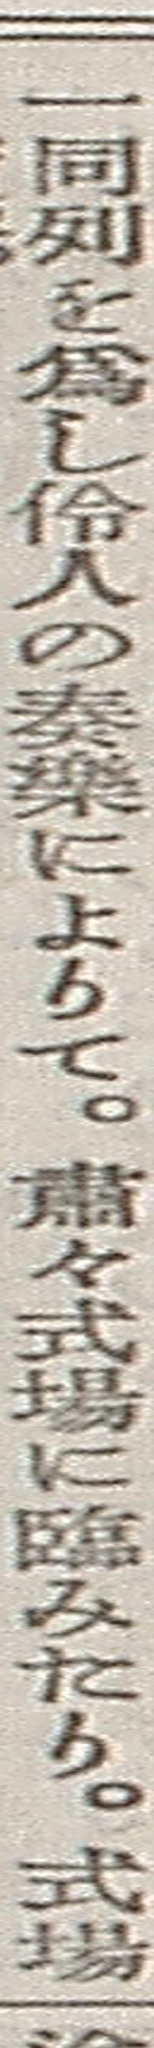一同列を為し伶人の奏楽によりて。粛々式場に臨みたり。式場
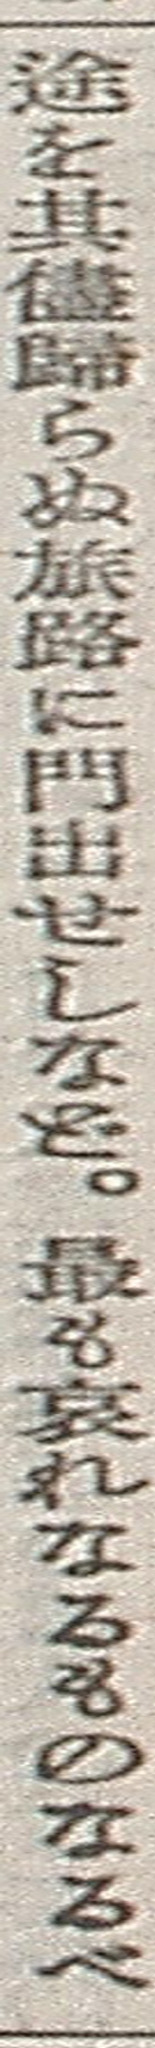途を其侭帰らぬ旅路に門出せしなど。最も哀れなるものなるべ
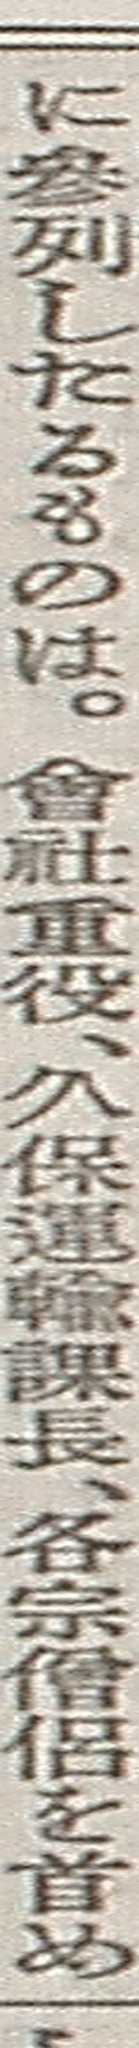に参列したるものは。会社重役、久保運輸課長、各宗僧侶を首め
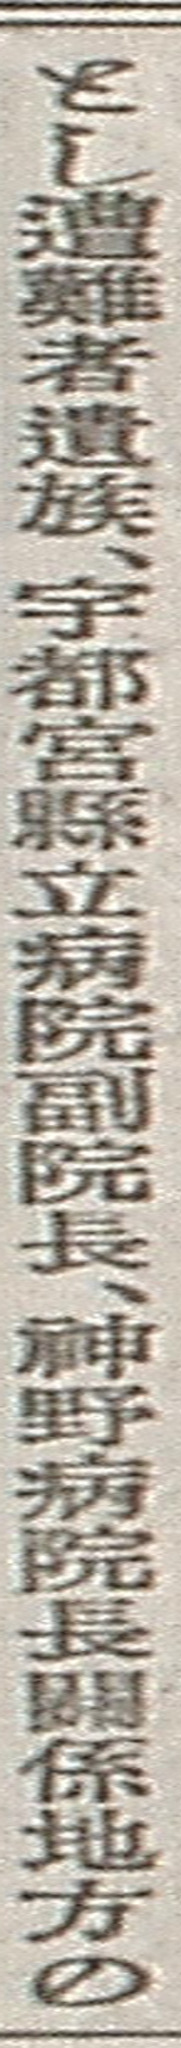とし遭難者遺族、宇都宮県立病院副院長、神野病院長関係地方の
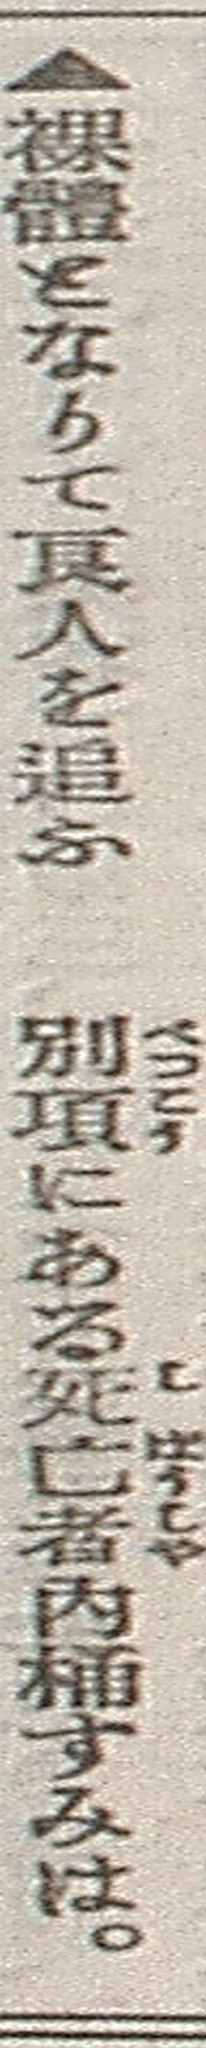▲裸体となりて良人を追ふ別項にある死亡者内桶すみは。

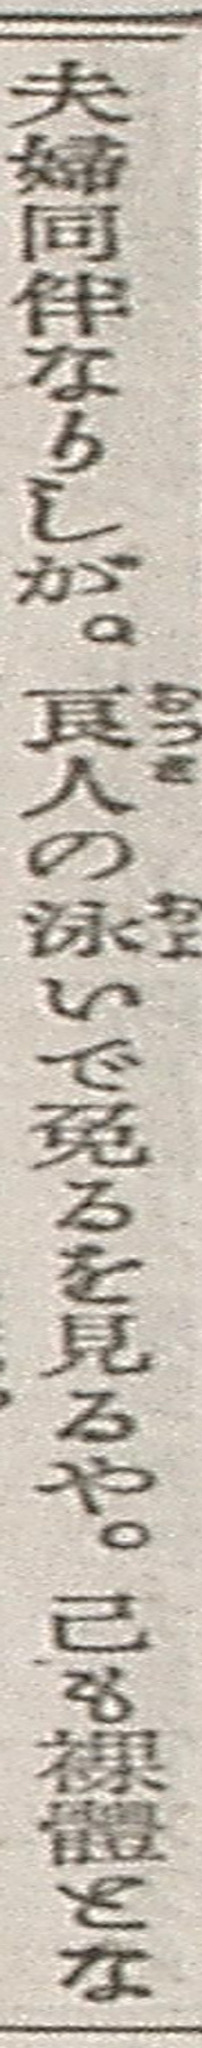夫婦同伴なりしが。良人の泳いで免るを見るや。己も裸体とな
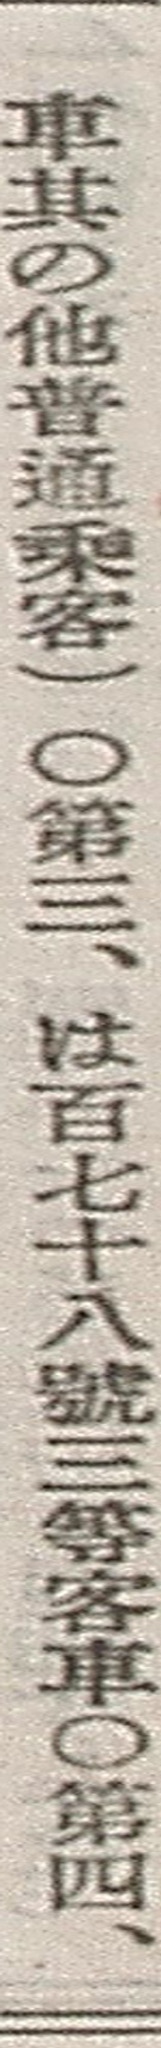車其の他普通乗客）○第三、は百七十八号三等客車○第四、
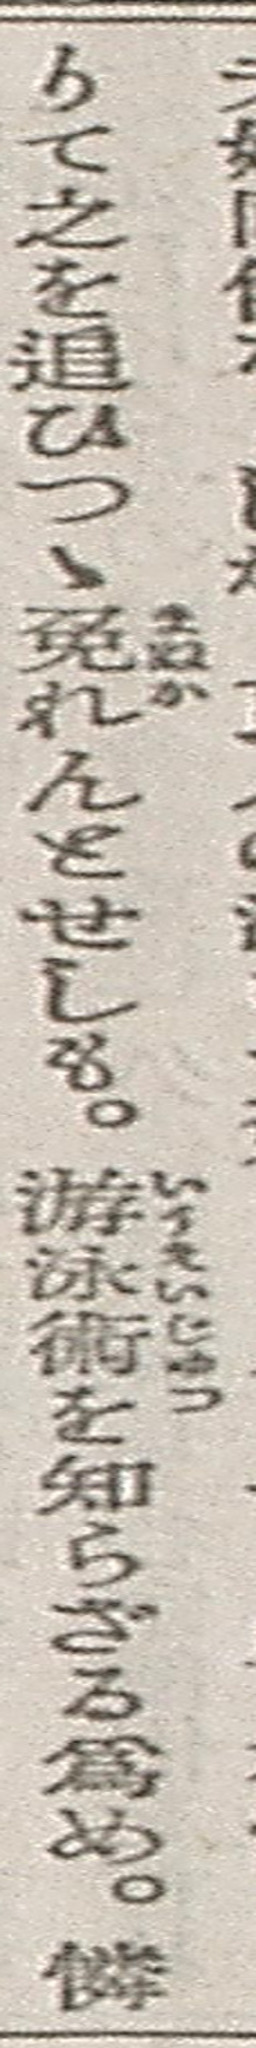りて之を追ひつゝ免れんとせしも。游泳術を知らざる為め。憐
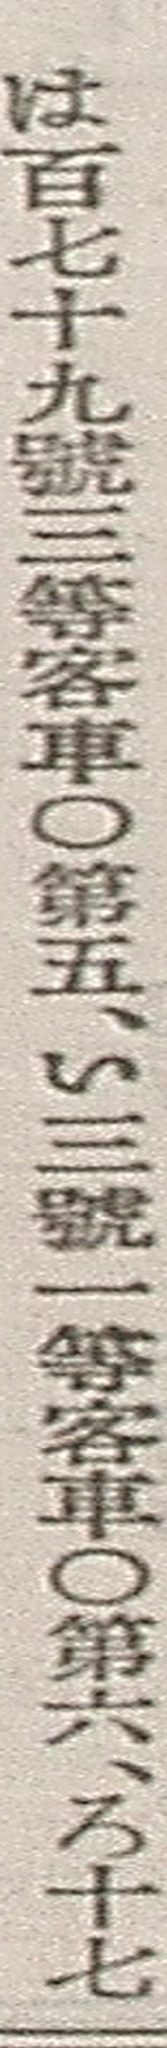は百七十九号三等客車○第五、い三号一等客車○第六、ろ十七
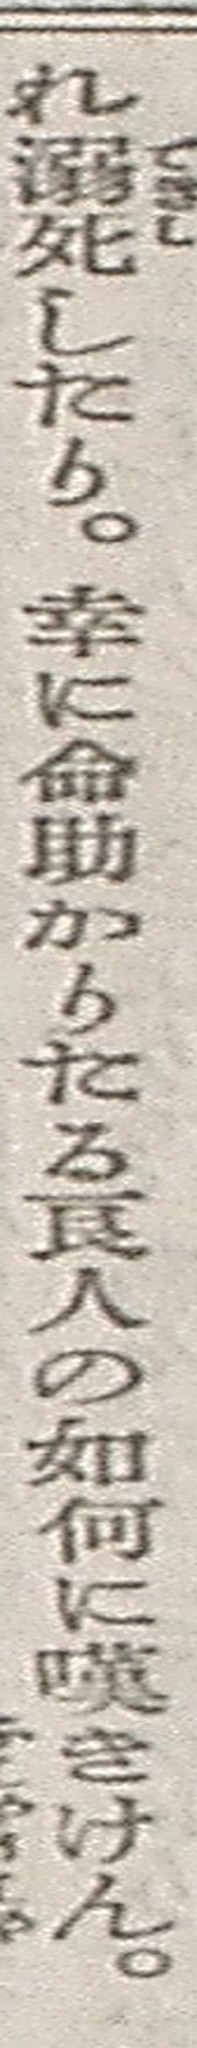れ溺死したり。幸に命助かりたる良人の如何に嘆きけん。
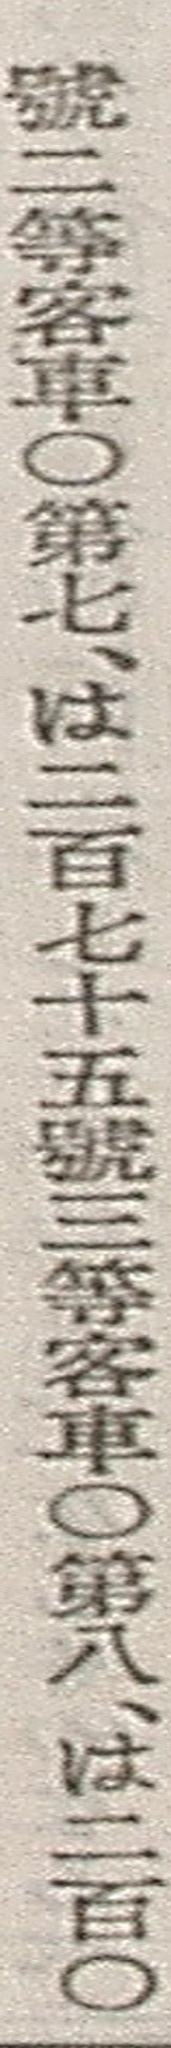号二等客車○第七、は二百七十五号三等客車○第八、は二百〇
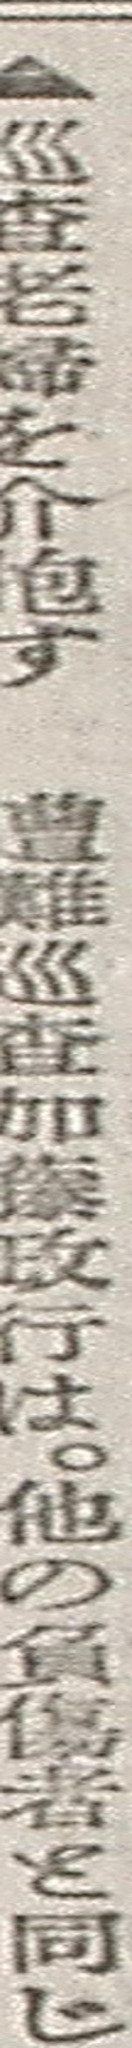▲巡査老婦を介抱す遭難巡査加藤政行は。他の負傷者と同じ
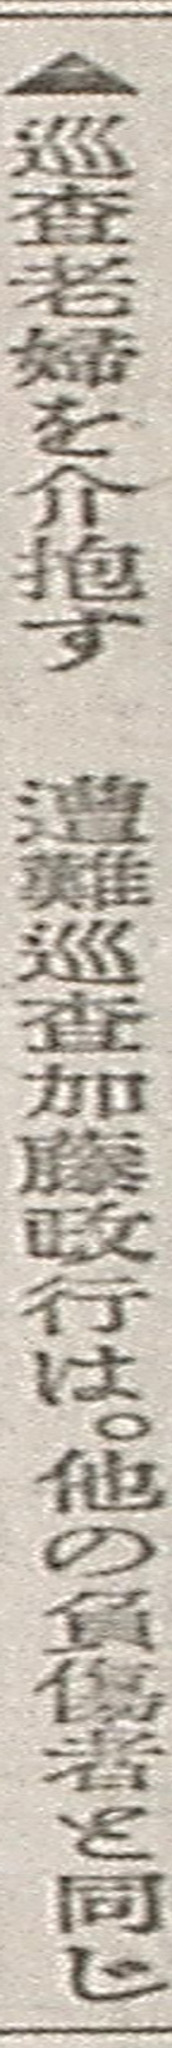▲巡査老婦を介抱す遭難巡査加藤政行は。他の負傷者と同じ
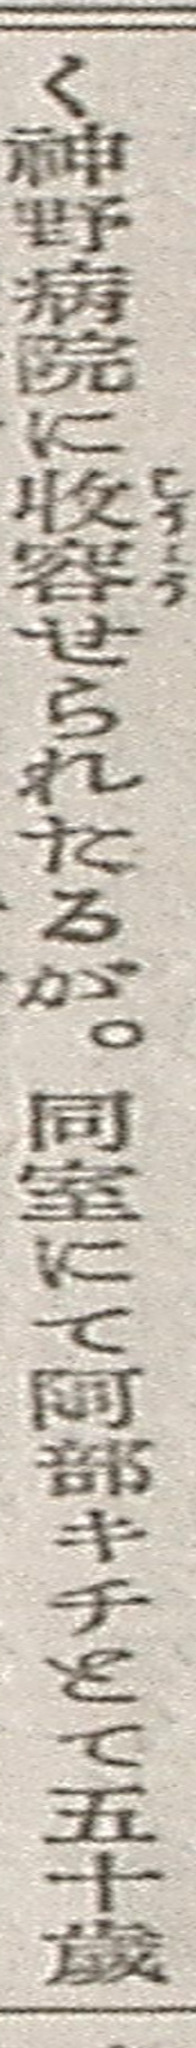く神野病院に収容せられたるが。同室にて阿部キチとて五十歳
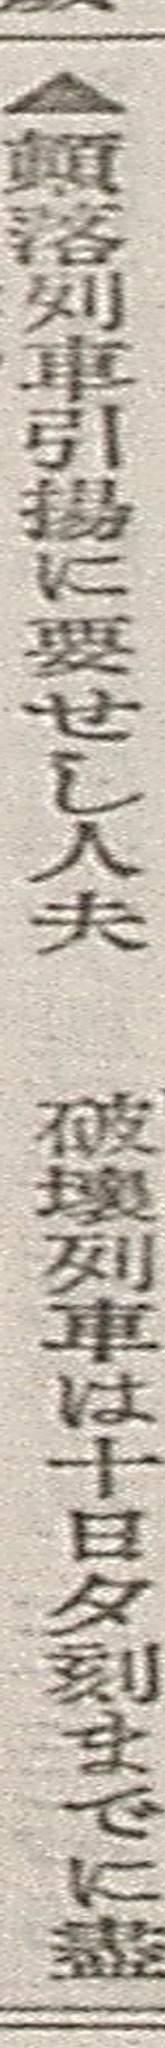▲顛落列車引揚に要せし人夫破壊列車は十日夕刻までに尽
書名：風俗畫報臨時増刊第百九十九號　明治三十二年十月各地災害圖會（前編之續）
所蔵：東京大学地震研究所図書室 Earthquake Research Institute Library, The University of Tokyo, JAPAN
